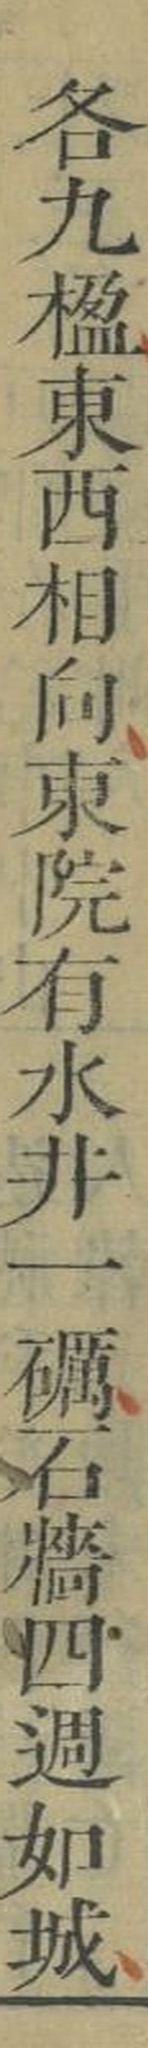各九楹東西相向東院有水井一礪石牆四週如城
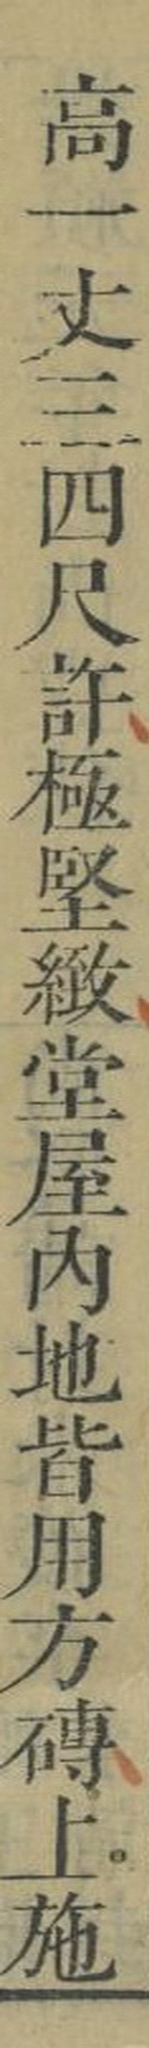高一丈三四尺許極堅緻堂屋内地皆用方磚上施
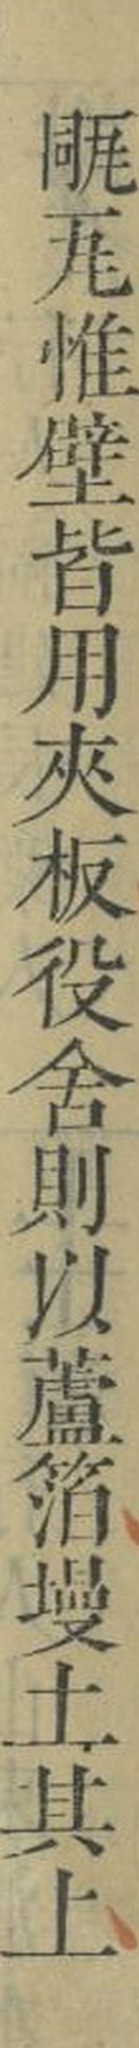瓦惟壁皆用夾板役舎則以蘆箔墁土其上
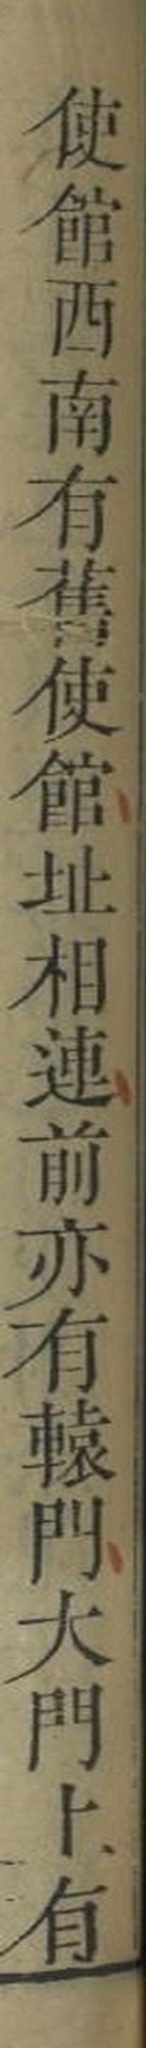使館西南有舊使館址相連前亦有轅門大門上有
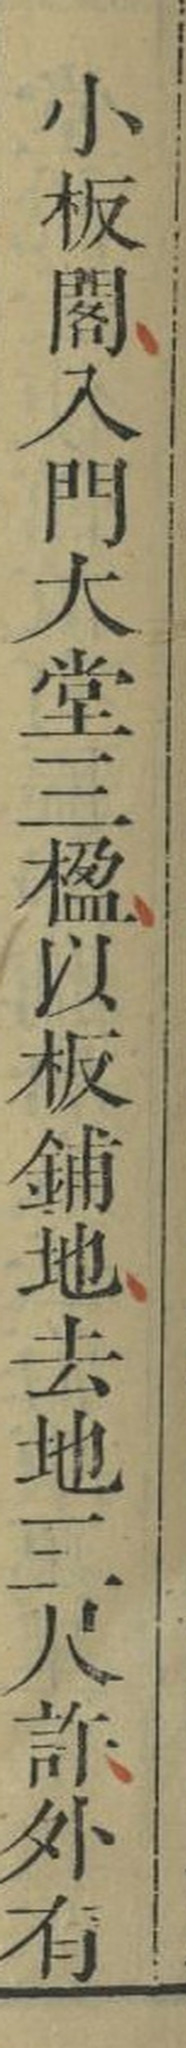小板閣入門大堂三楹以板鋪地去地三尺許外有
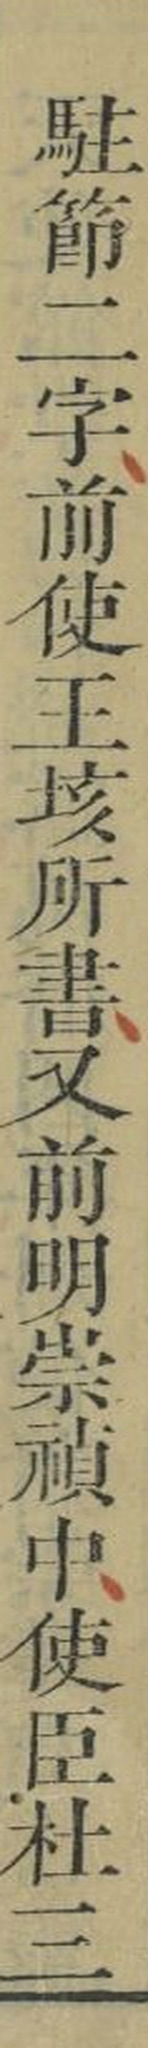駐節二字前使王垓所書又前明崇禎中使臣杜三
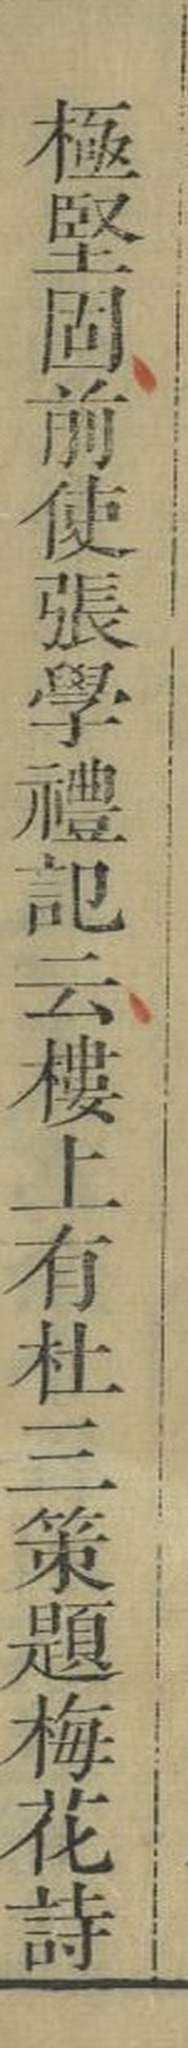極堅固前使張學禮記云樓上有杜三策題梅花詩
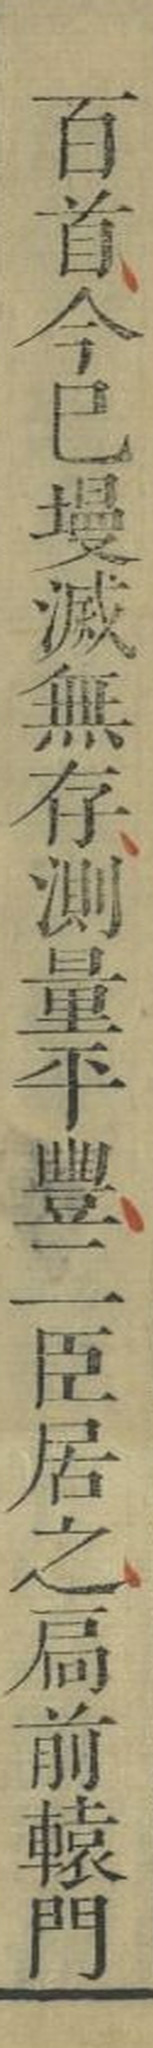百首今巳墁滅無存測量平豐二臣居之扃前轅門
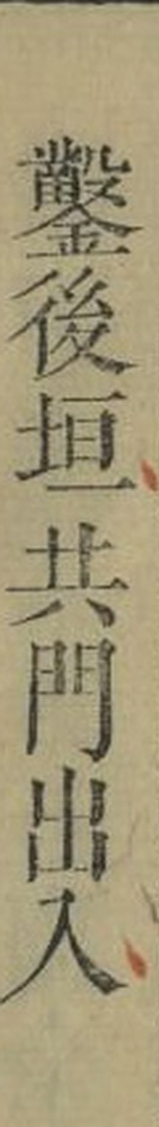鑿後垣共門出入
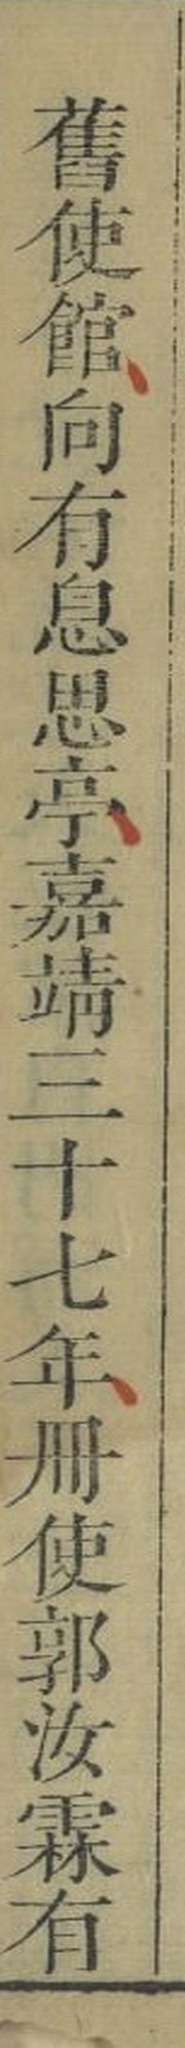舊使館向有息思亭嘉靖三十七年冊使郭汝霖有

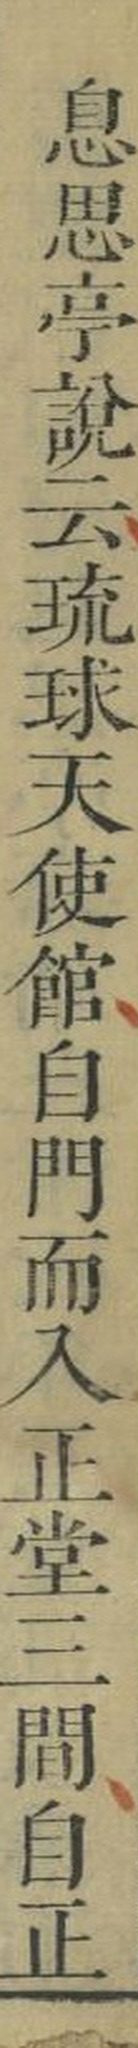息思亭說云琉球天使館自門而入正堂三間自正
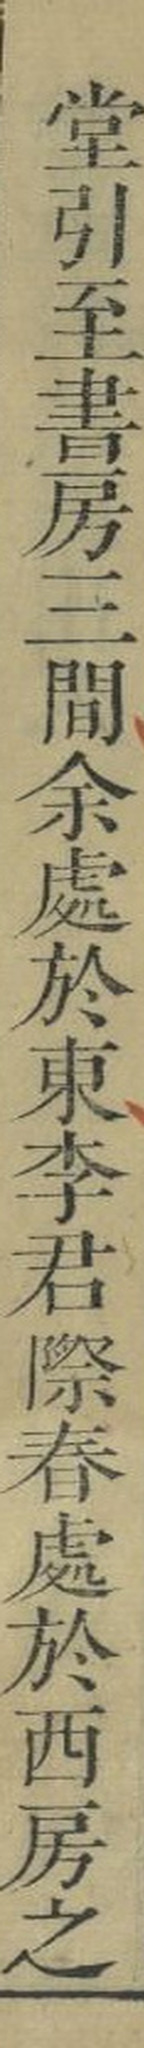堂引至書房三間余處於東李君際春處於西房之
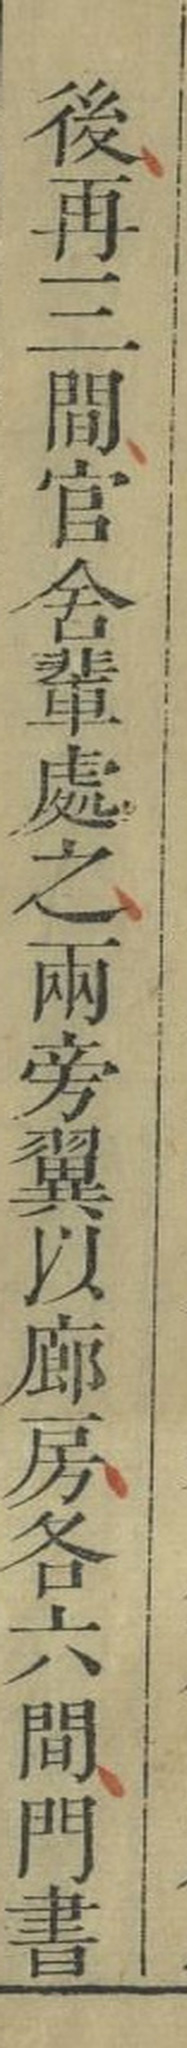後再三間官舎輩處之兩旁翼以廊房各六間門書
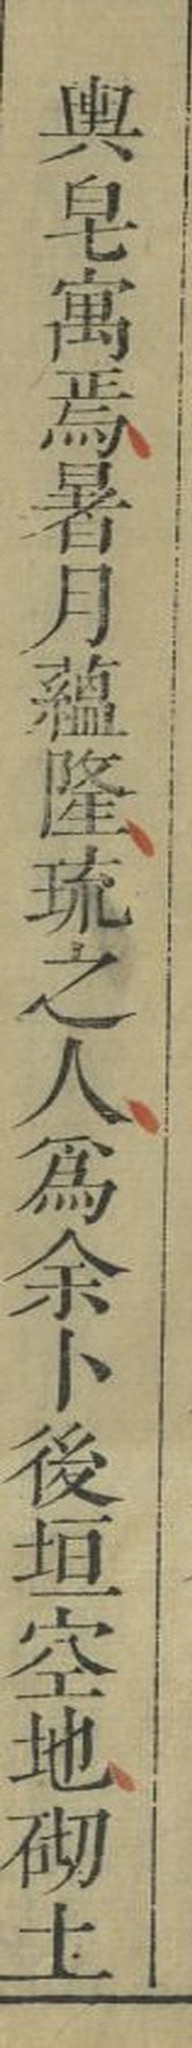輿皂寓焉暑月蘊隆琉之人爲余卜後垣空地砌土
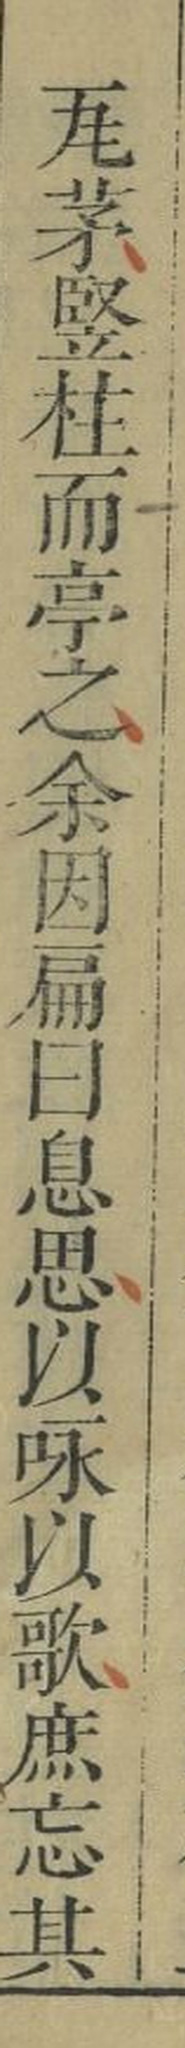瓦茅竪柱而亭之余因扁曰息思以咏以歌庶忘其
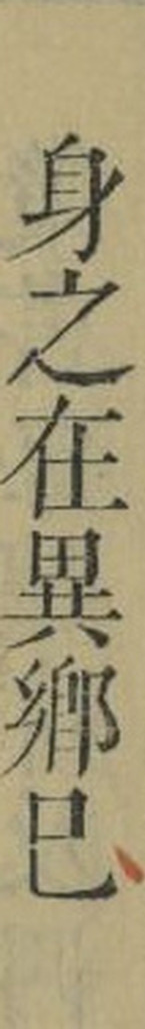身之在異鄕巳
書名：中山伝信録 巻一、巻二
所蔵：University of the Ryukyus Library
